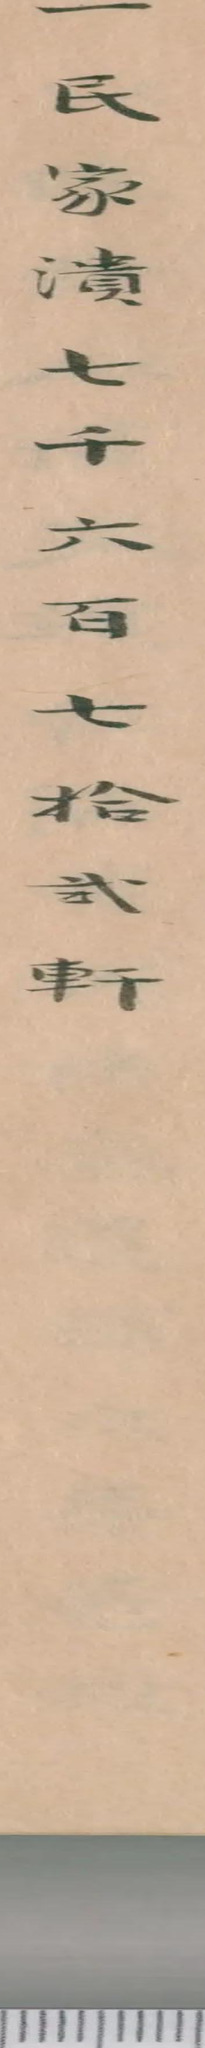一民家潰七千六百七拾弐軒
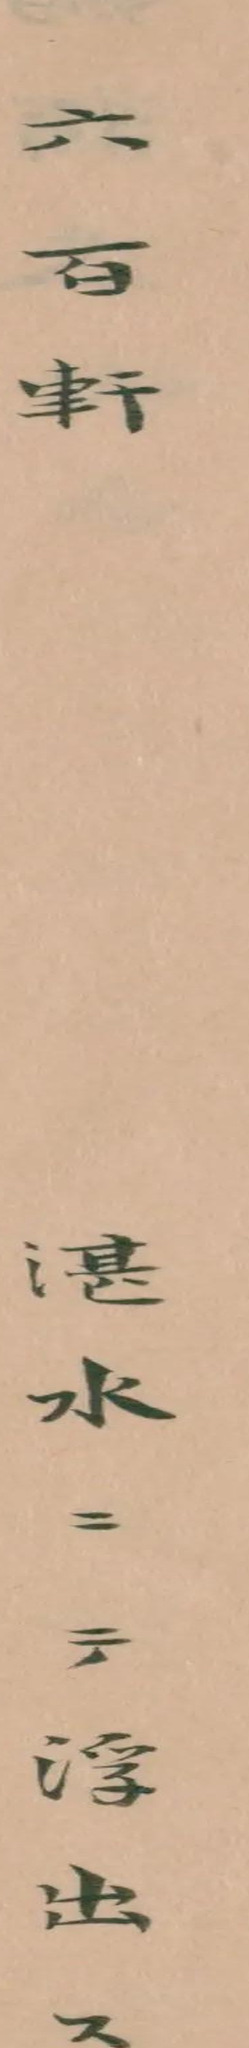六百軒湛水ニテ浮出ス
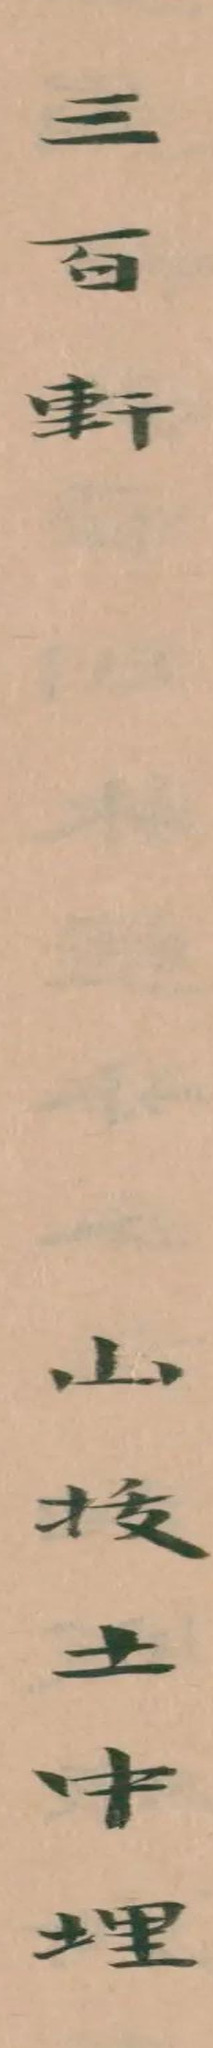三百軒山抜土中埋
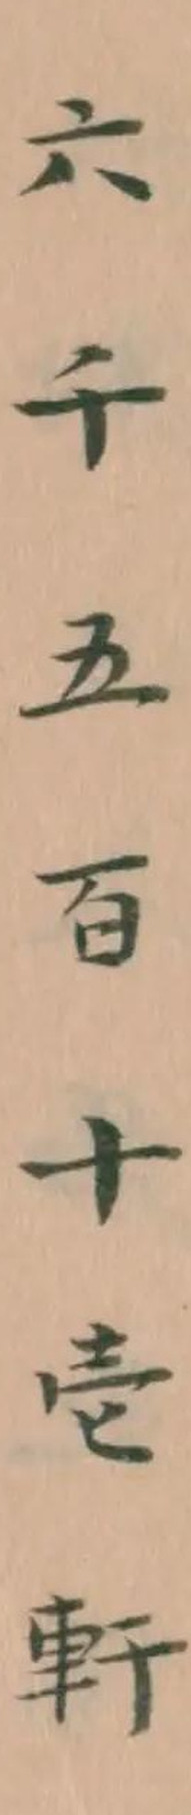六千五百十壱軒潰
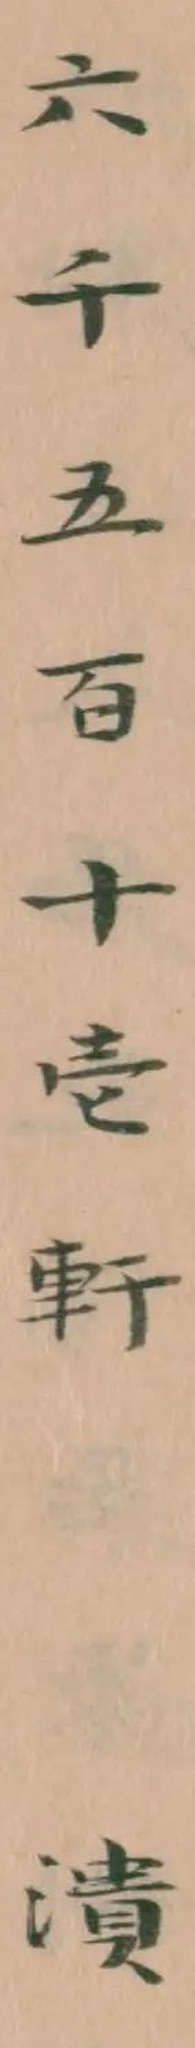六千五百十壱軒潰
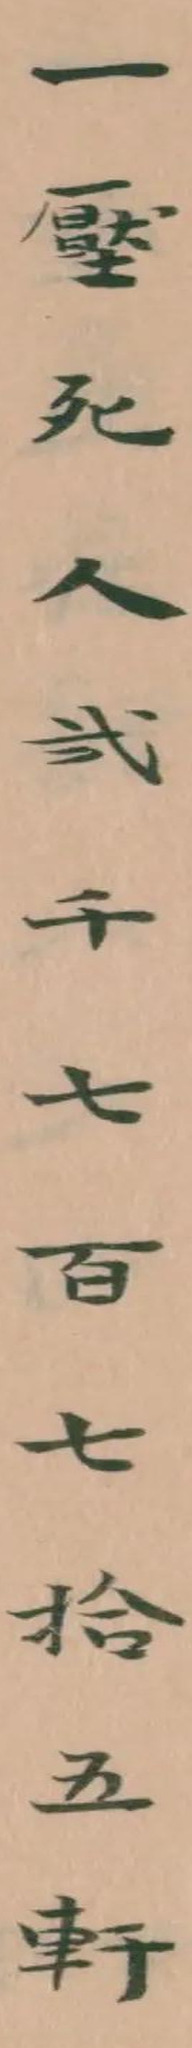一圧死人弐千七百七拾五軒
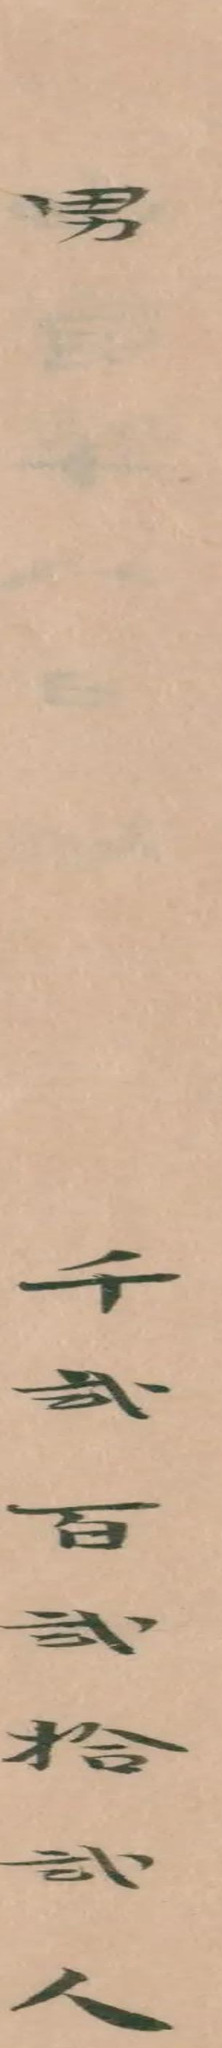男千弐百弐拾弐人
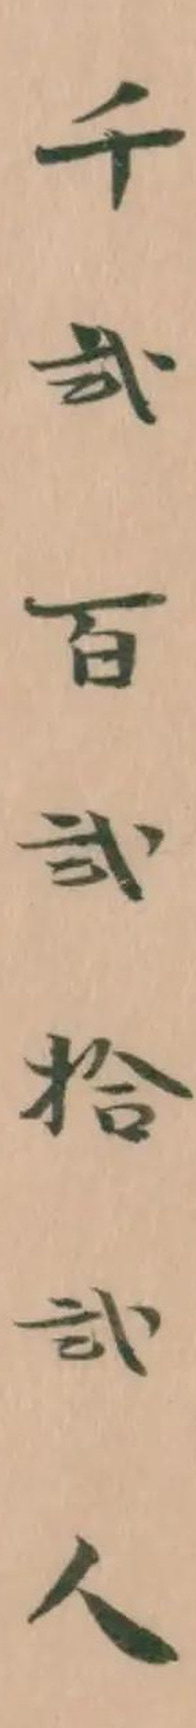男千弐百弐拾弐人
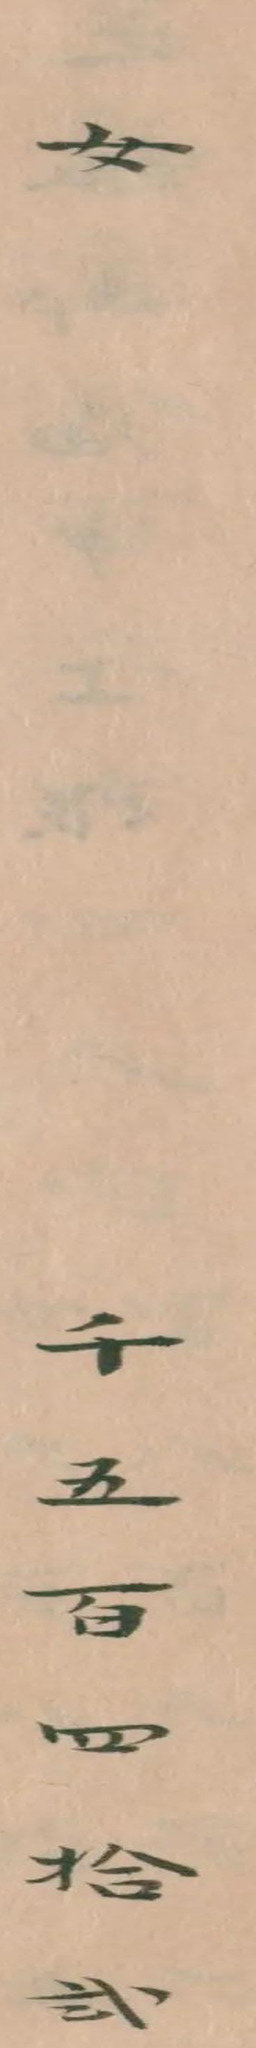女千五百四拾弐人
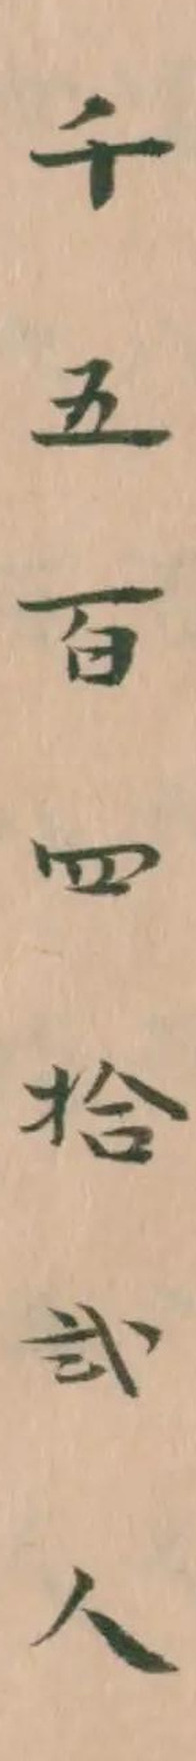女千五百四拾弐人
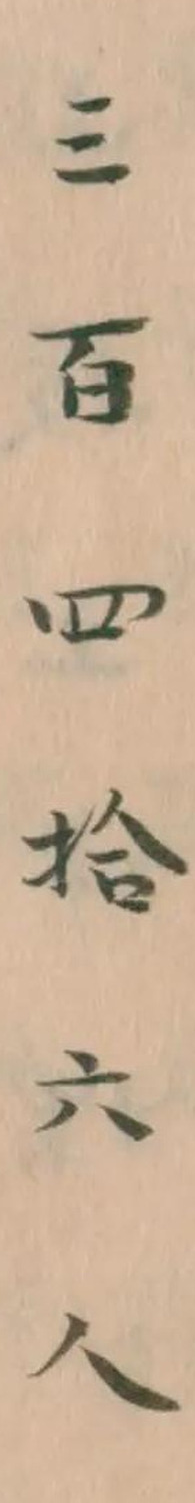内三百四拾六人
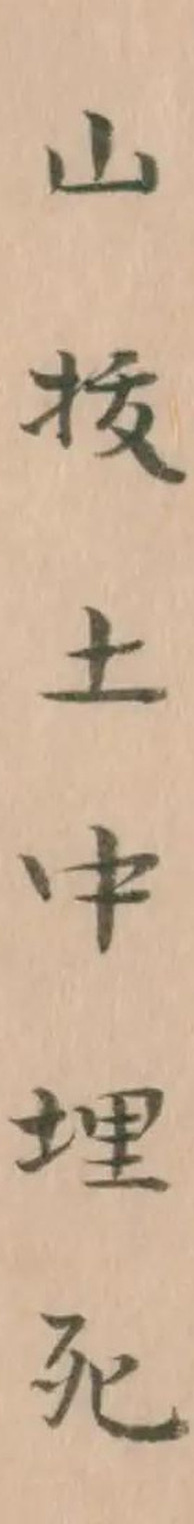山抜土中埋死
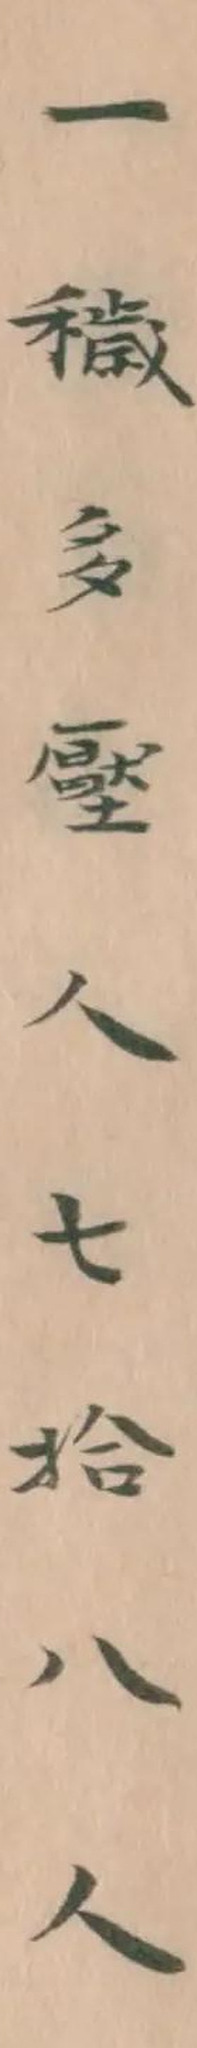一穢多圧人七拾八人

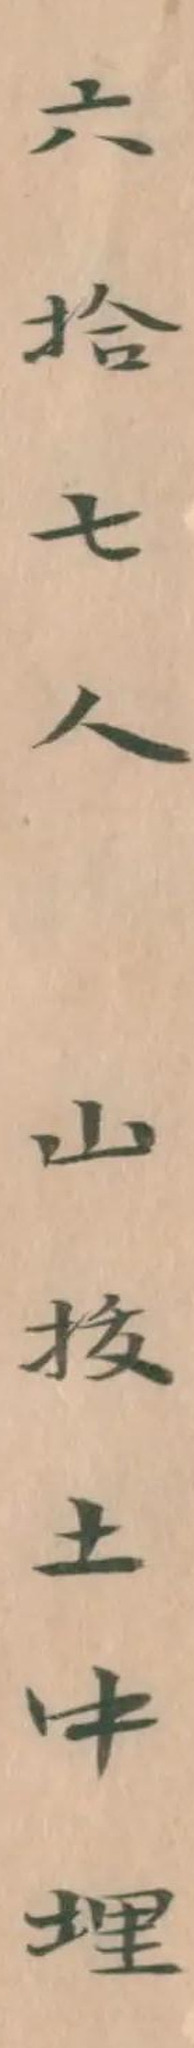六拾七人山抜土中埋
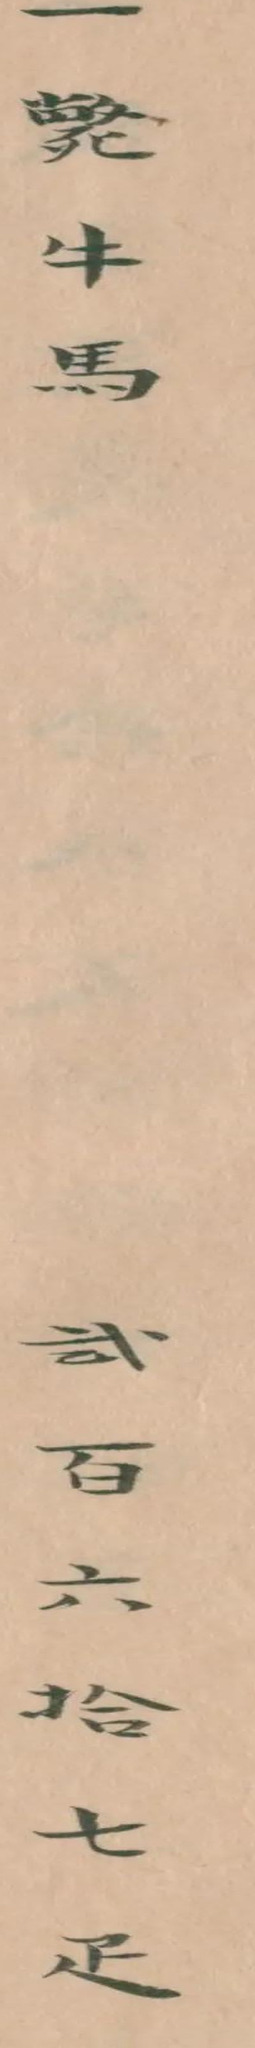一斃牛馬弐百六拾七疋
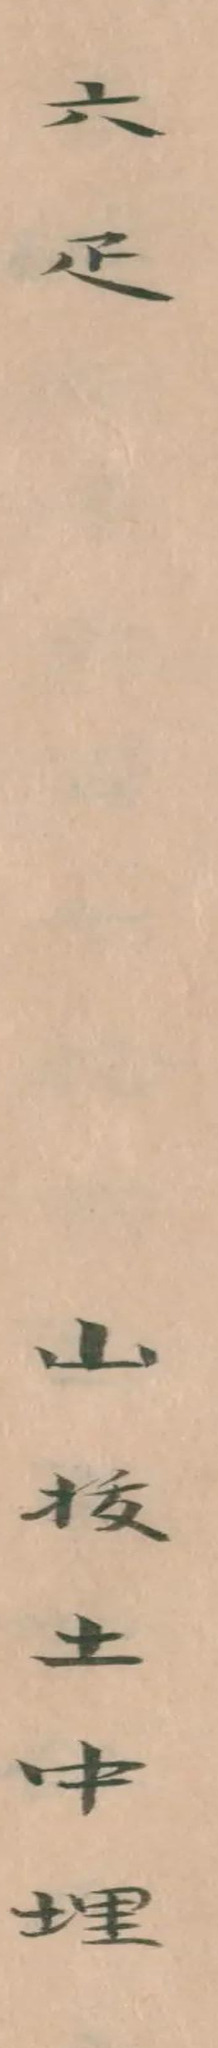六疋山抜土中埋
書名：地災撮要. 巻5-6(地震之部)
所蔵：国立国会図書館 National Diet Library, JAPAN
